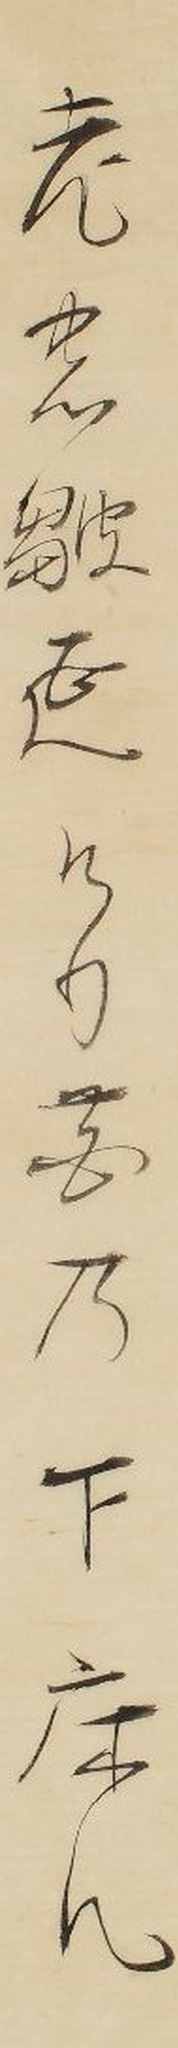老の皺延けり花の下床几
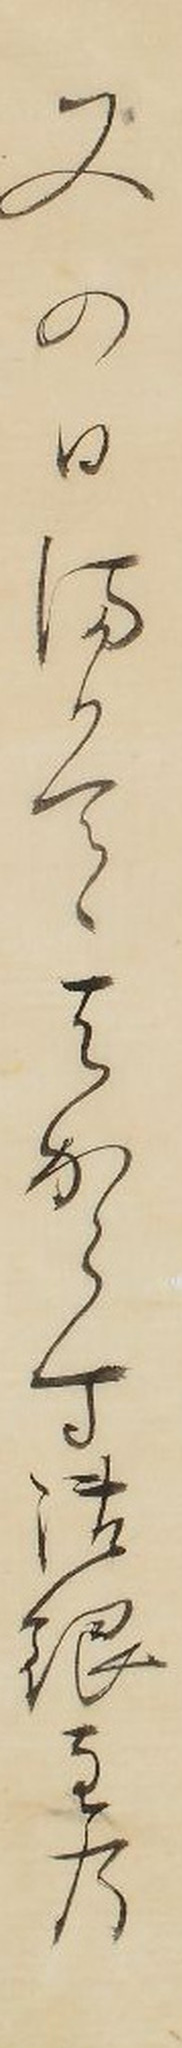又の日まかてゝはからす御銀主の
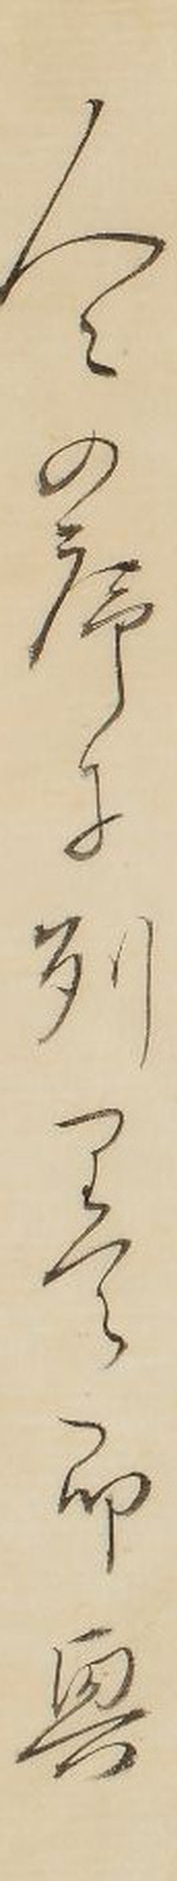人々の序に列りて即興
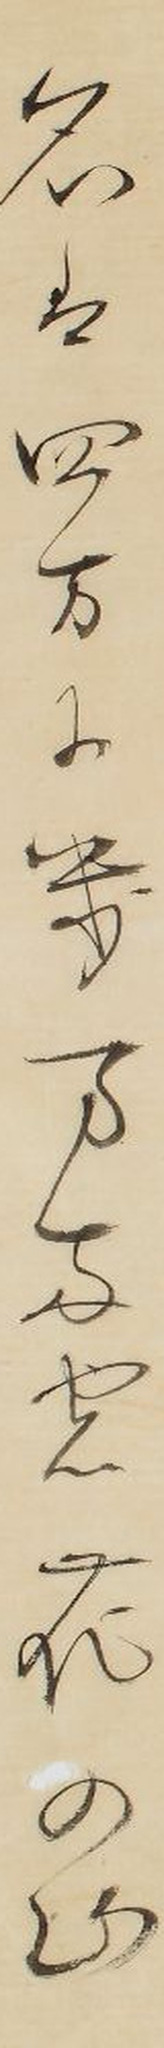名は四万に幾万両の花の山
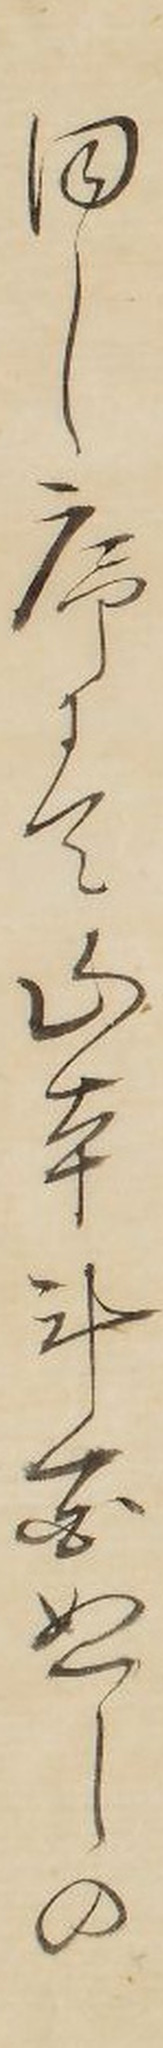同し序にて山本斗百ぬしの
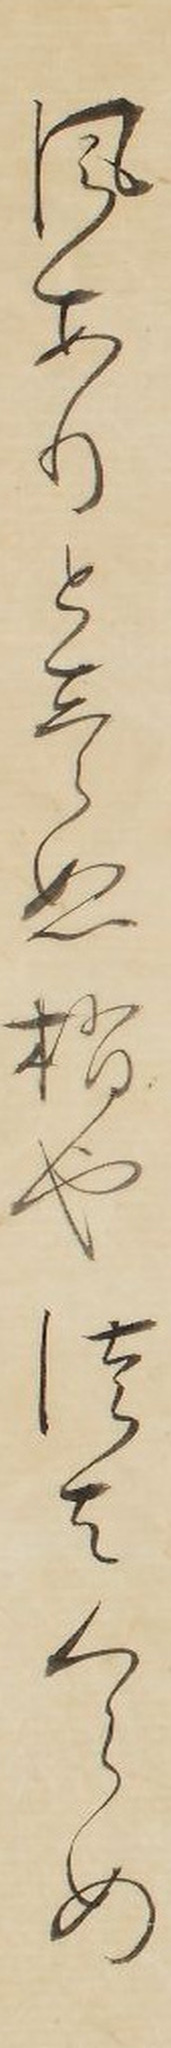風ありとしらぬ梢やつはくらめ
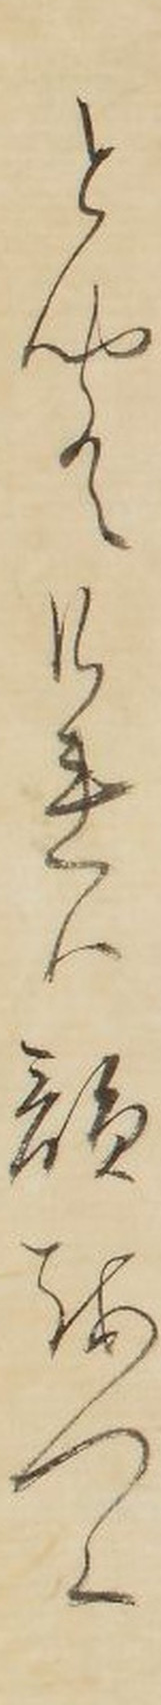と聞えけれは韻をつく

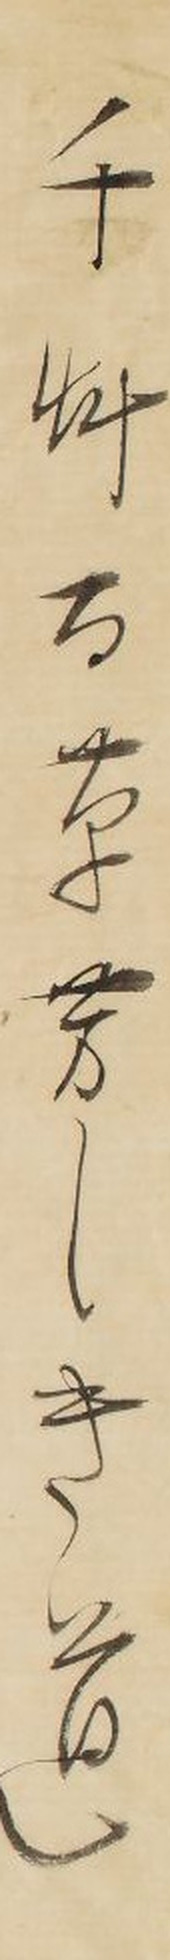千草百草芳しき道
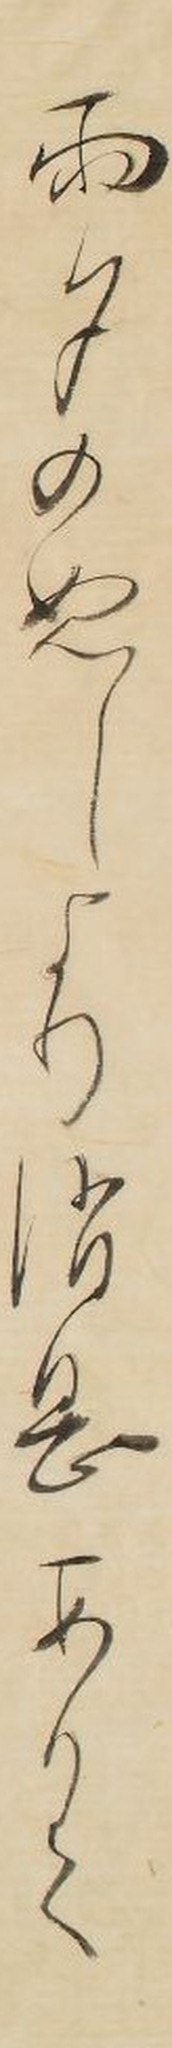雨夕のぬしより消息ありて
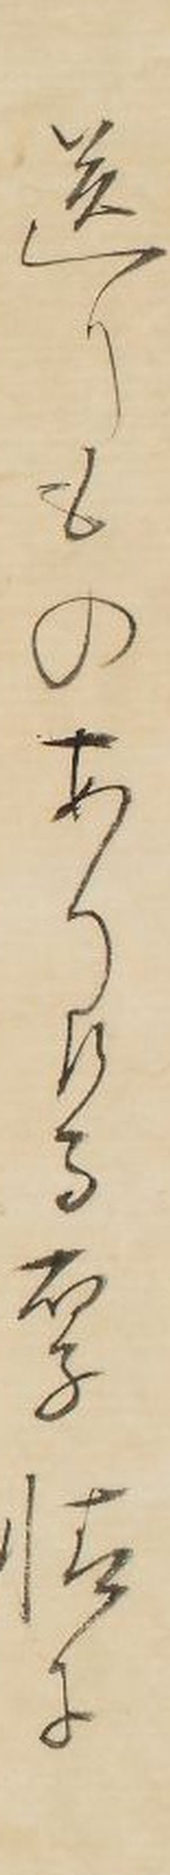送りものありける厚情に
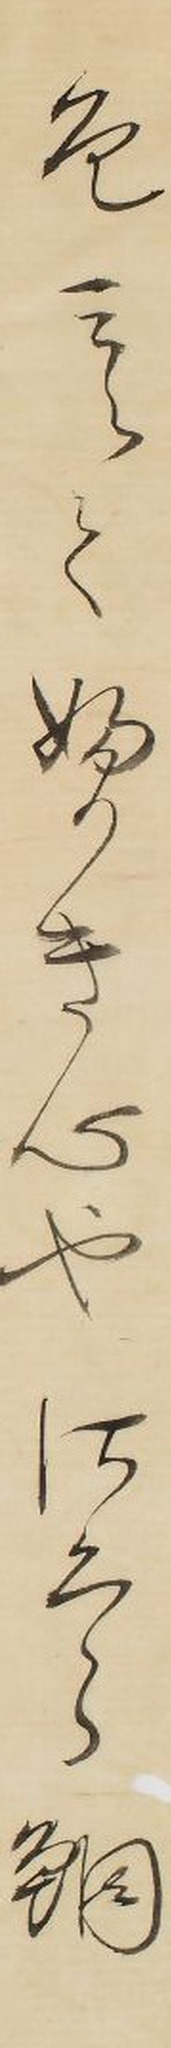色みえてふかき心やさくら鯛
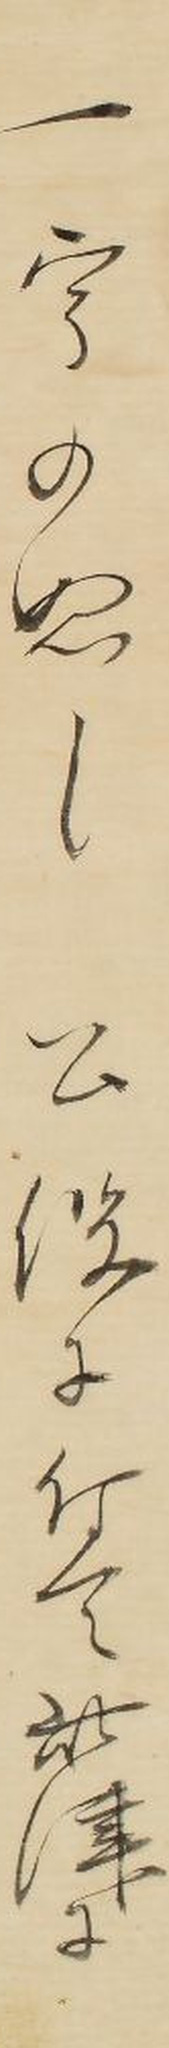一宇のぬし公役に付て此津に
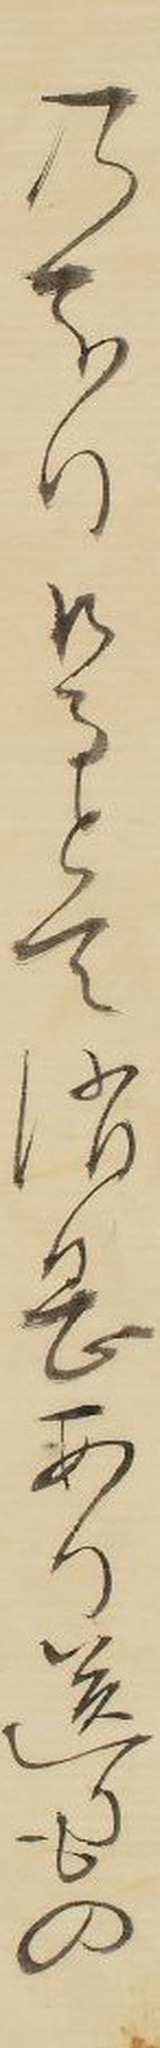のほりけるとて消息あり送りもの
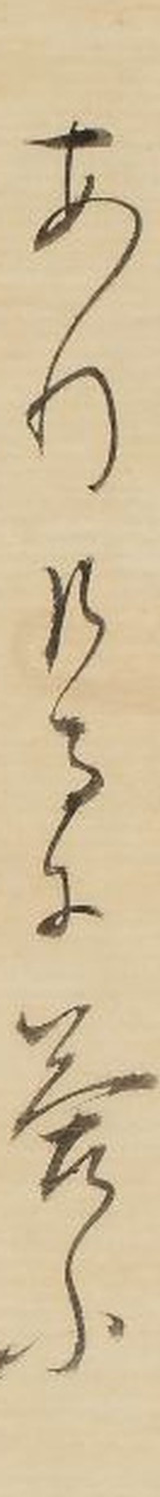ありけるに答ふ
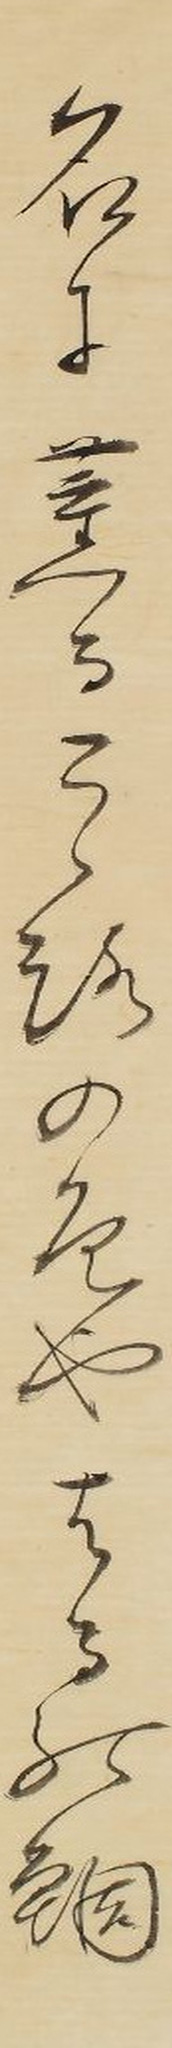名に薫るこゝろの色やはるの鯛
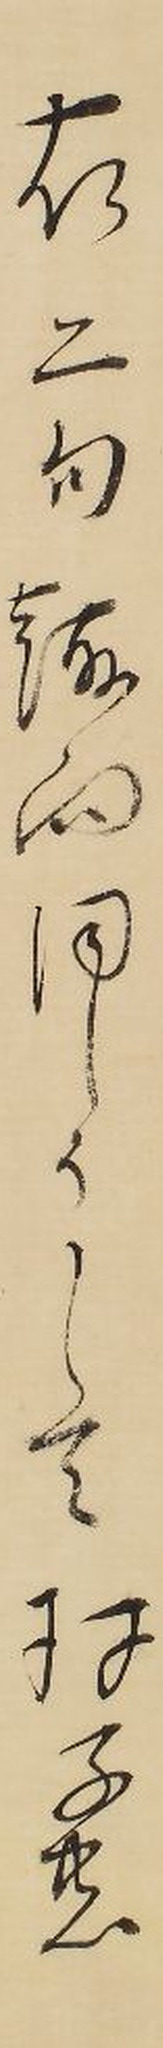右二句趣向同しうして村子の
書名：花土産
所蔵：徳島県立図書館
